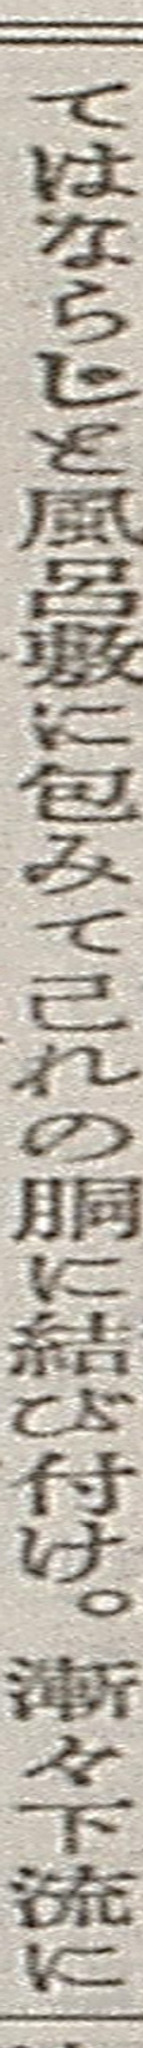てはならじと風呂敷に包みて己れの胴に結び付け。漸々下流に
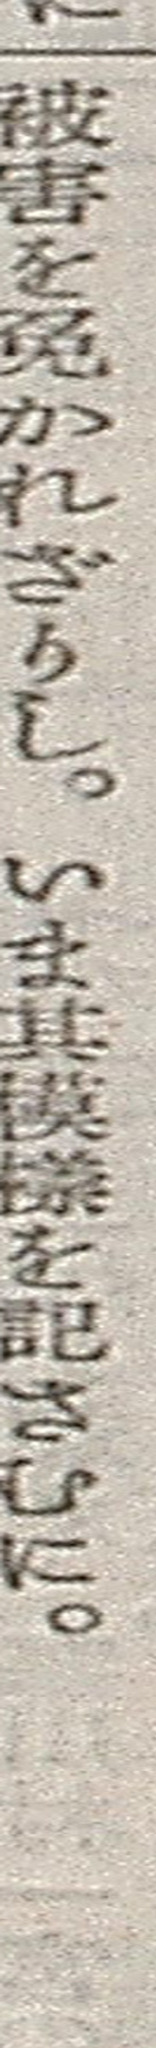被害を免かれざりし。いま其模様を記さむに。
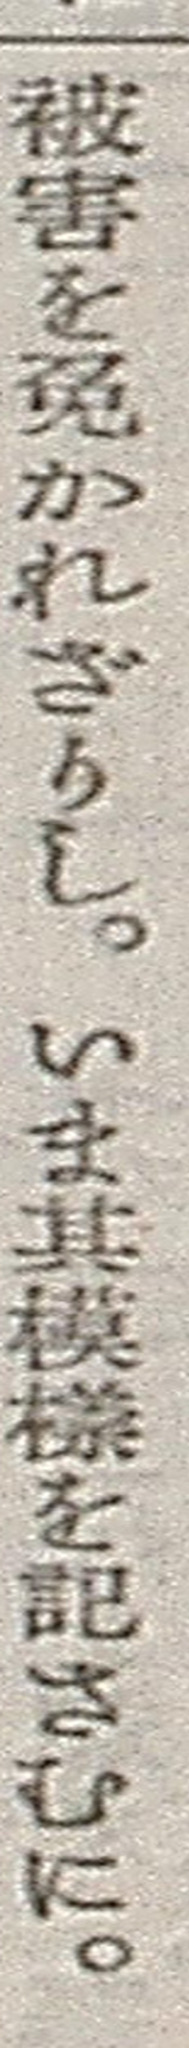被害を免かれざりし。いま其模様を記さむに。
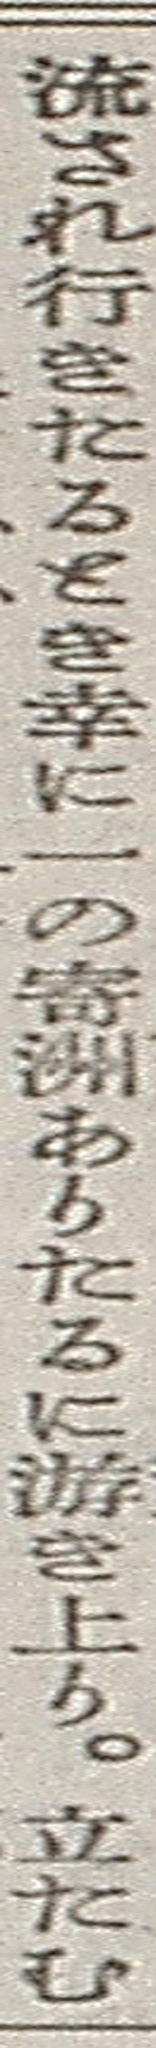流され行きたるとき幸に一の寄洲ありたるに游き上り。立たむ
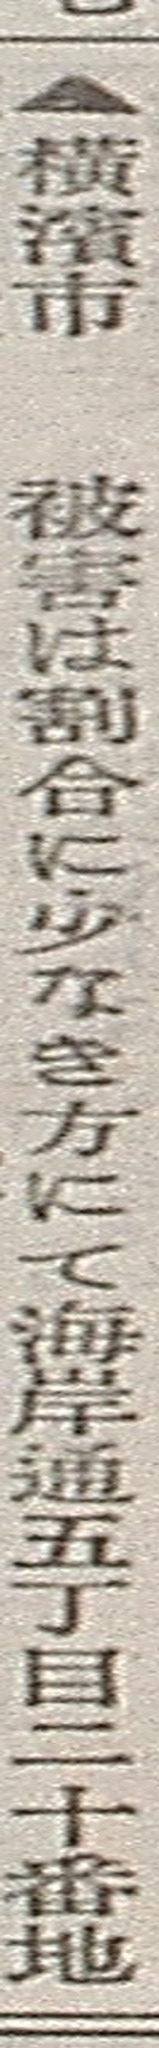▲横浜市被害は割合に少なき方にて海岸通五丁目二十番地
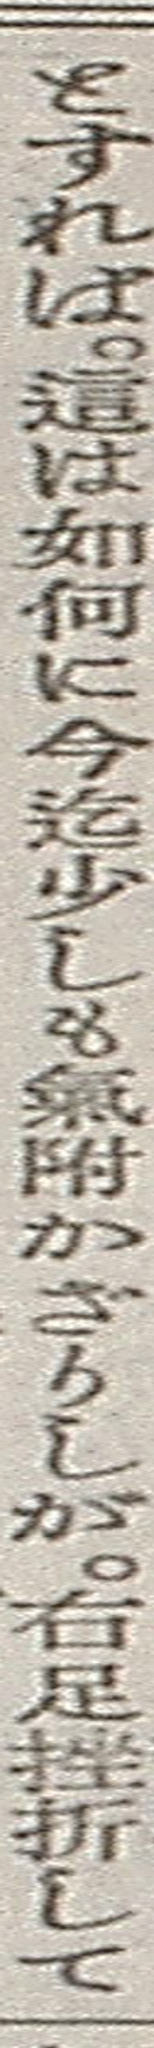とすれば。這は如何に今迄少しも気附かざりしが。右足挫折して
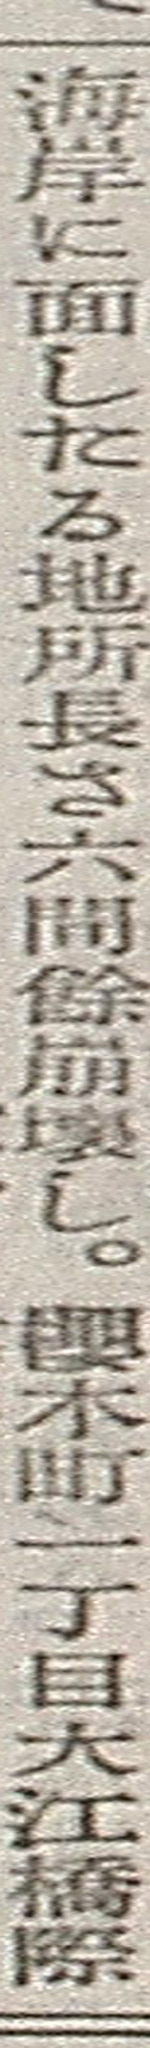海岸に面したる地所長さ六間余崩壊し。桜木町一丁目大江橋際
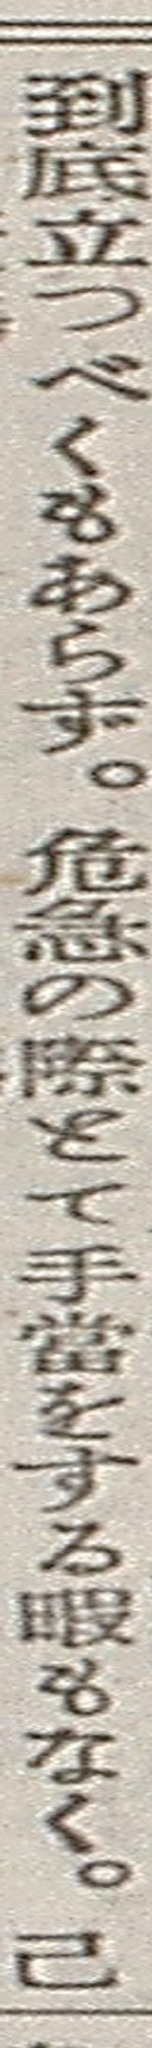到底立つべくもあらず。危急の際とて手当をする暇もなく。己
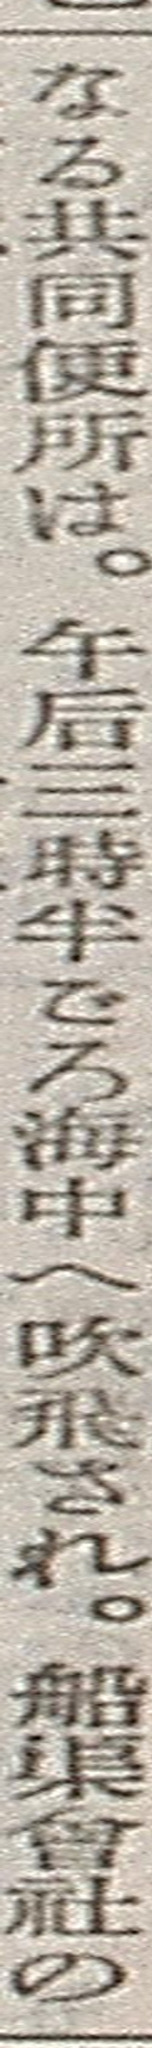なる共同便所は。午后三時半ごろ海中へ吹飛され。船渠会社の
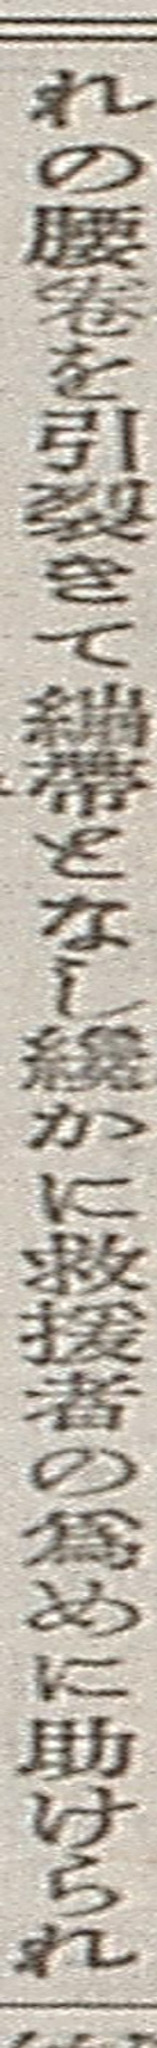れの腰巻を引裂きて繃帯となし纔かに救援者の為めに助けられ
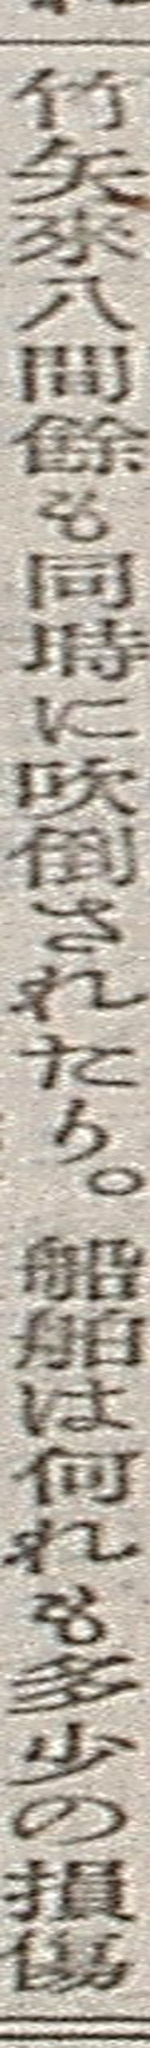竹矢来八間余も同時に吹倒されたり。船舶は何れも多少の損傷
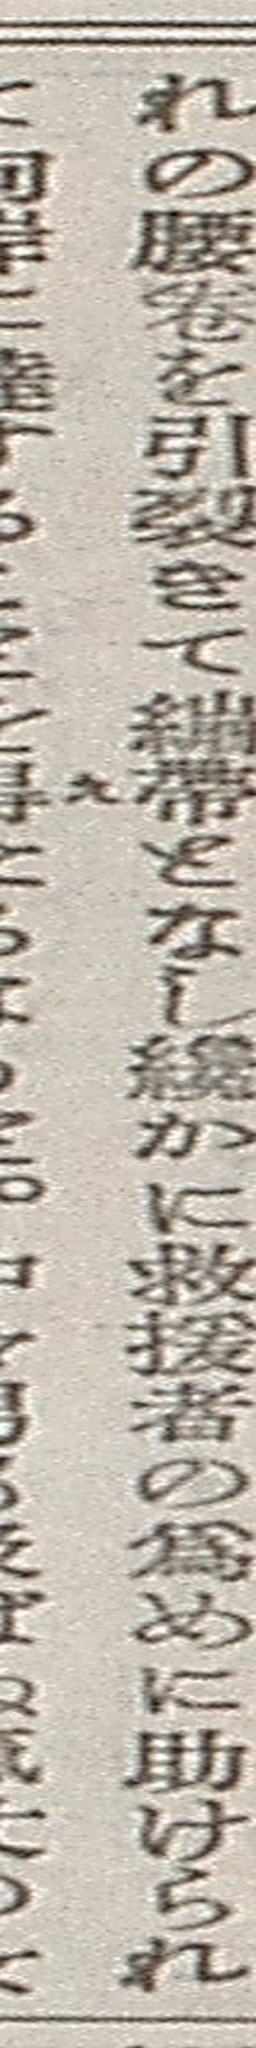て向岸に達することを得たるなりと。中々男も及ばぬ気丈の女
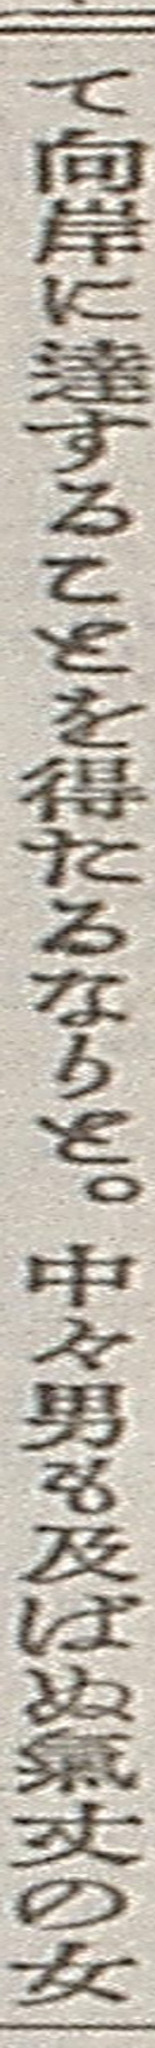て向岸に達することを得たるなりと。中々男も及ばぬ気丈の女
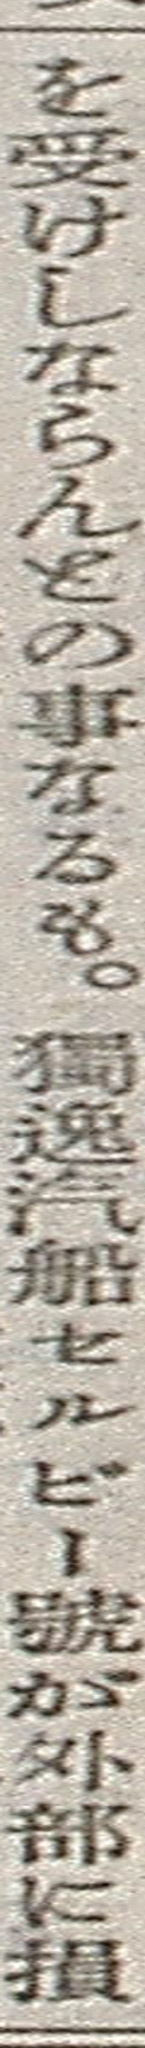を受けしならんとの事なるも。独逸汽船セルビー号が外部に損
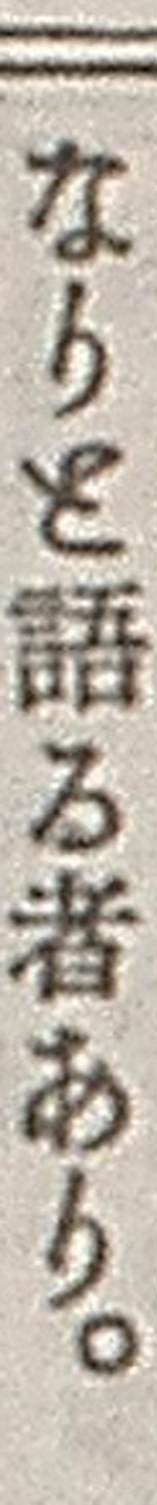なりと語る者あり。
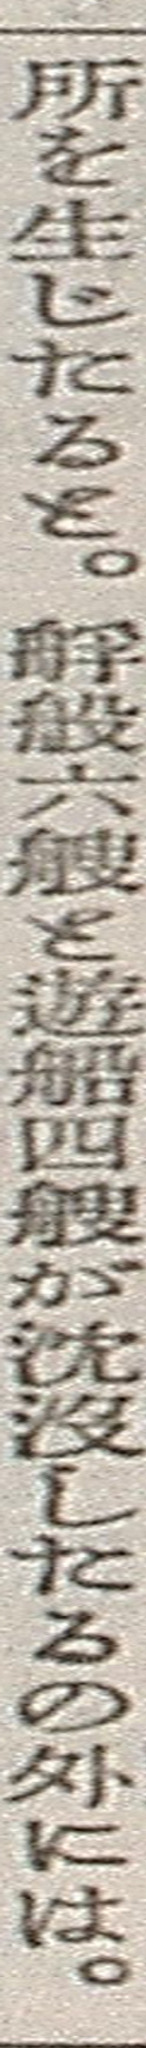所を生じたると。艀般六艘と遊船四艘が沈没したるの外には。
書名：風俗畫報臨時増刊第百九十九號　明治三十二年十月各地災害圖會（前編之續）
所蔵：東京大学地震研究所図書室 Earthquake Research Institute Library, The University of Tokyo, JAPAN
